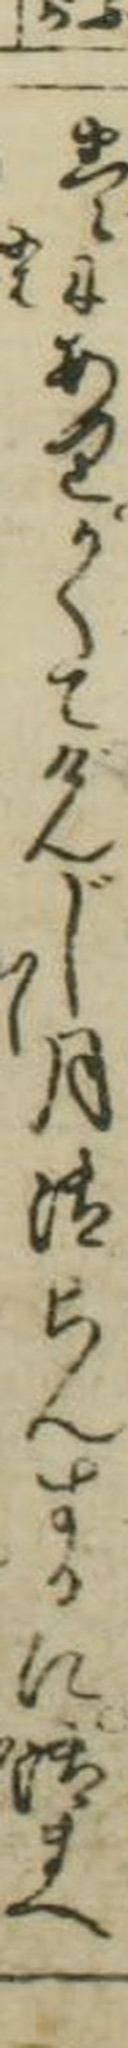巻にあり。かくてげんじ月御らんするに。御まへ
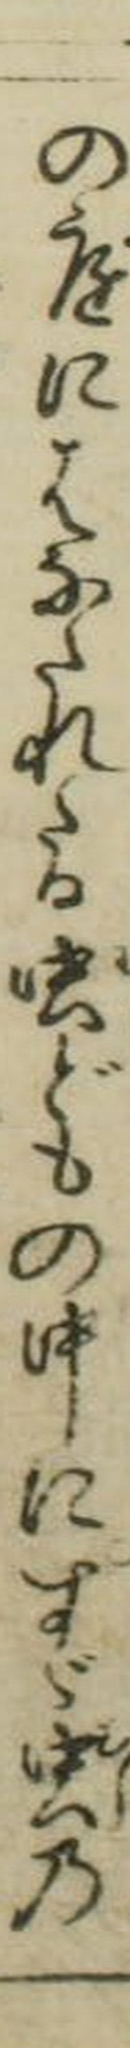の庭にはなたれたる虫どもの中にすゞ虫の
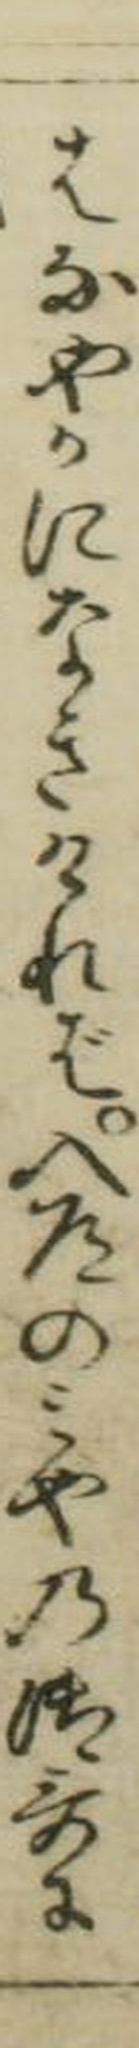はなやかになきければ。入道のみやの御哥に
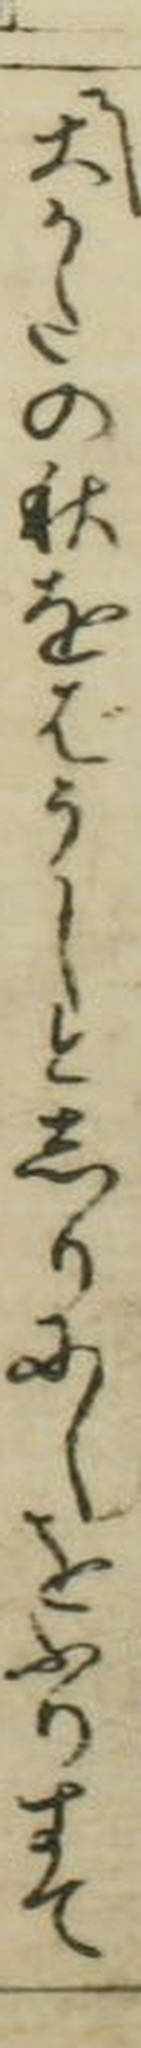〽大かたの秋をばうしとしりにしをふりすて
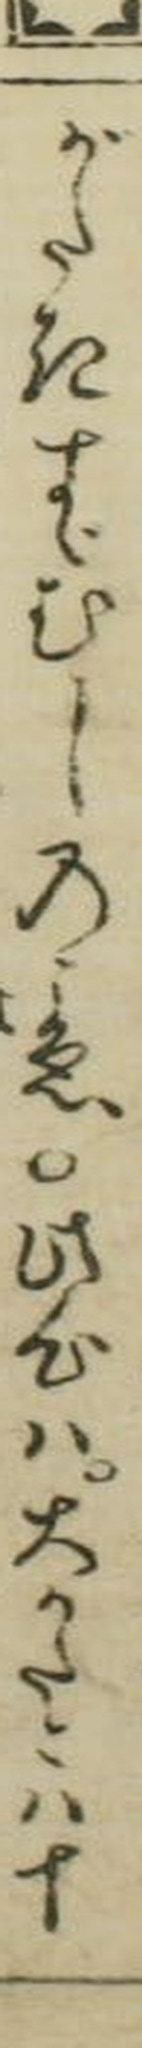がたきすゞむしのこゑ◯此心は。大かたとは十
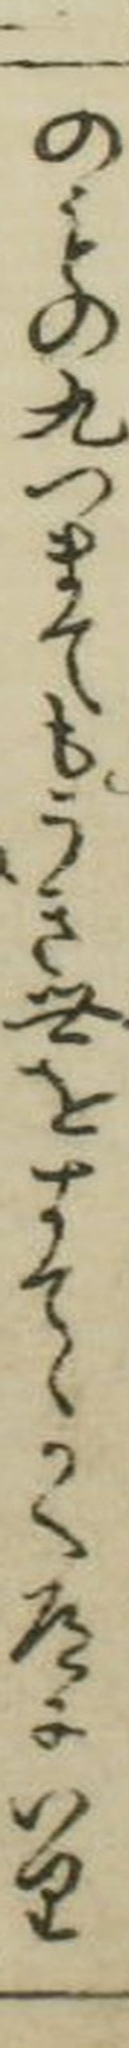のことの九つまても。うき世をすてゝかく道にいり
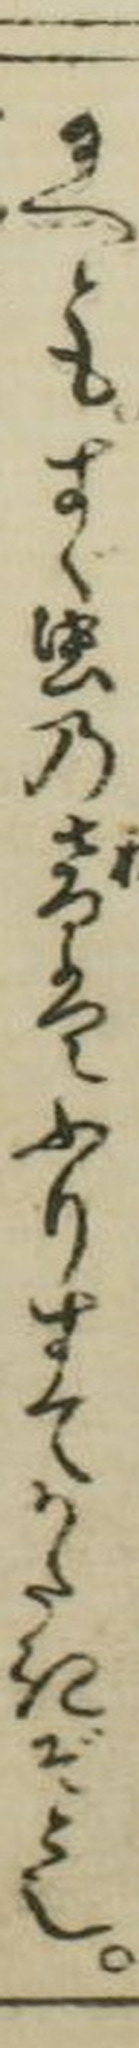給へとも。すゞ虫の音はふりすてかたきぞと也。
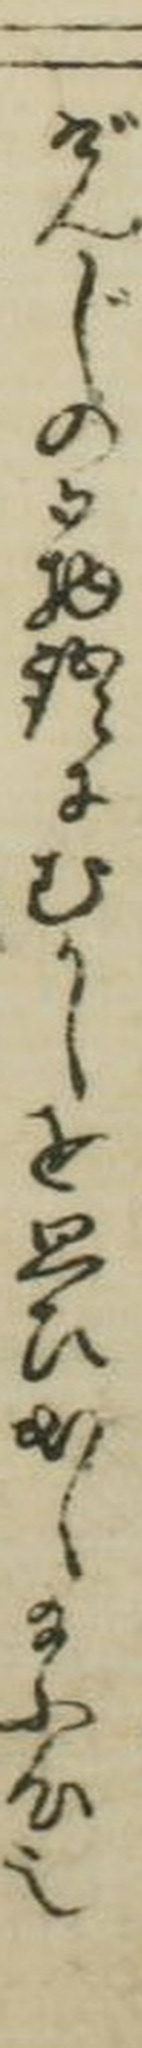げんじの御物語にむかしを思ひ出し給ふ心也
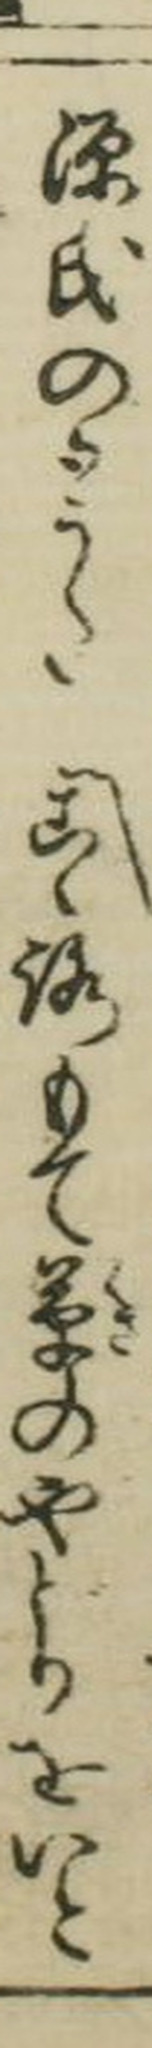源氏の御うた〽こゝろもて草のやどりをいと
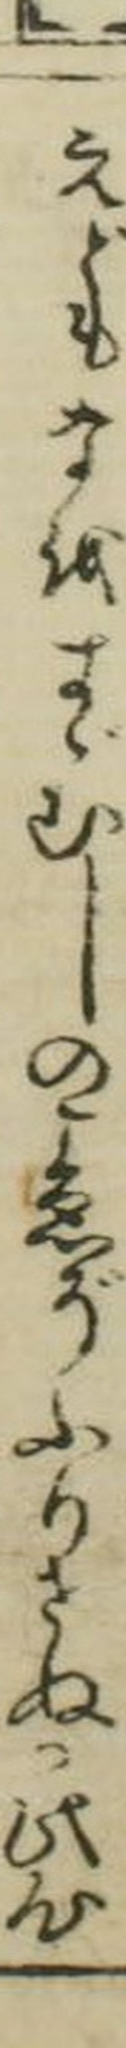えどもなをすゞむしのこゑぞふりせぬ◯此心
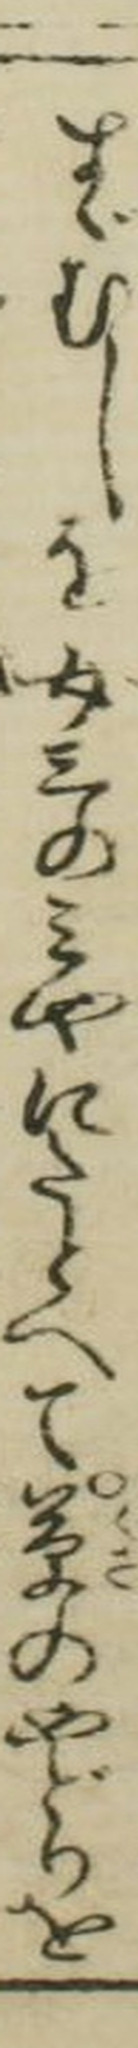すゞむしを女三のみやにたとへて。草のやどりを
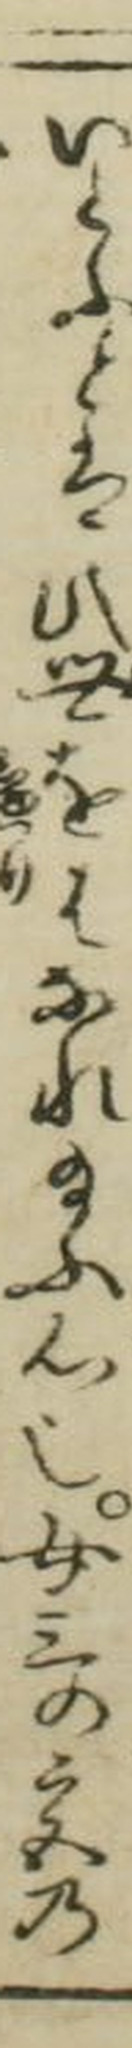いとふとは此世をはなれ給ふ心也。女三の宮の
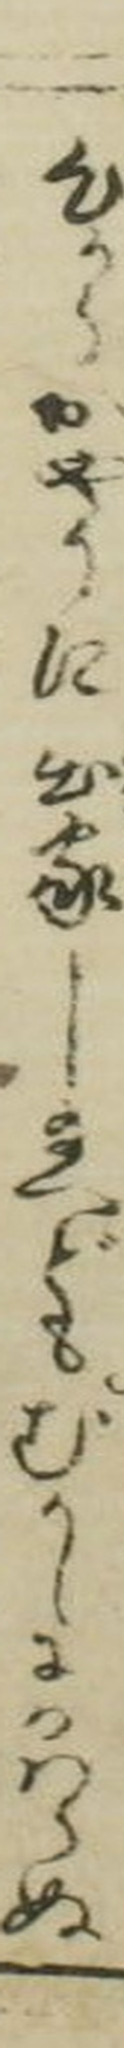心からかやうに出家し給へども。むかしにかはらぬ
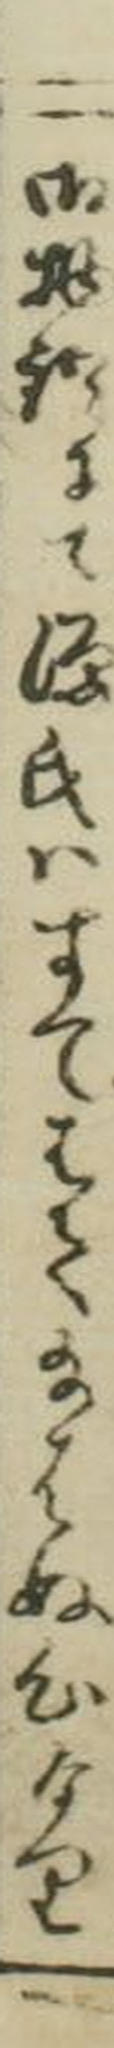御物語にて源氏はすてはて給はぬ心なり
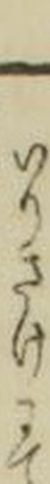いりさけ
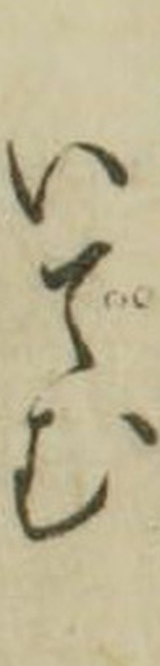いでむ
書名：女源氏教訓鑑
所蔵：東京学芸大学附属図書館
